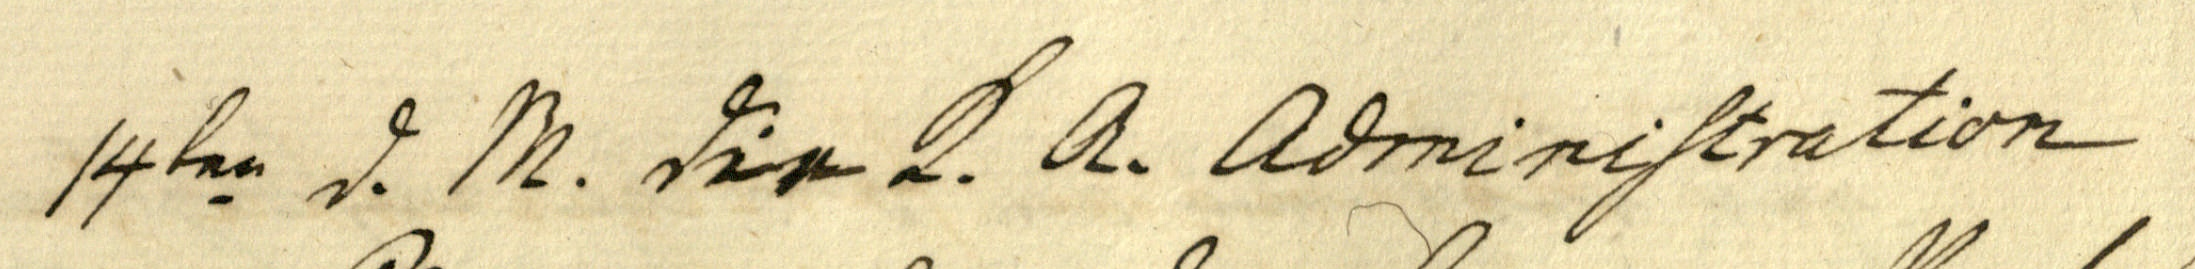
14 ten d. M. die K. A. Administration
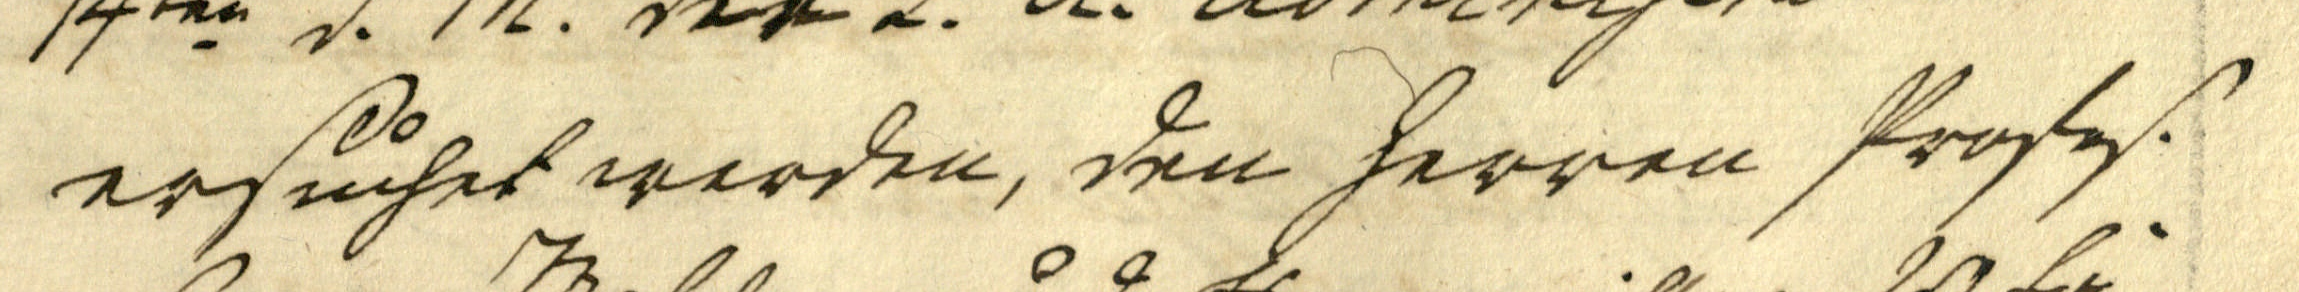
ersuchet werden, den Herren Profes¬
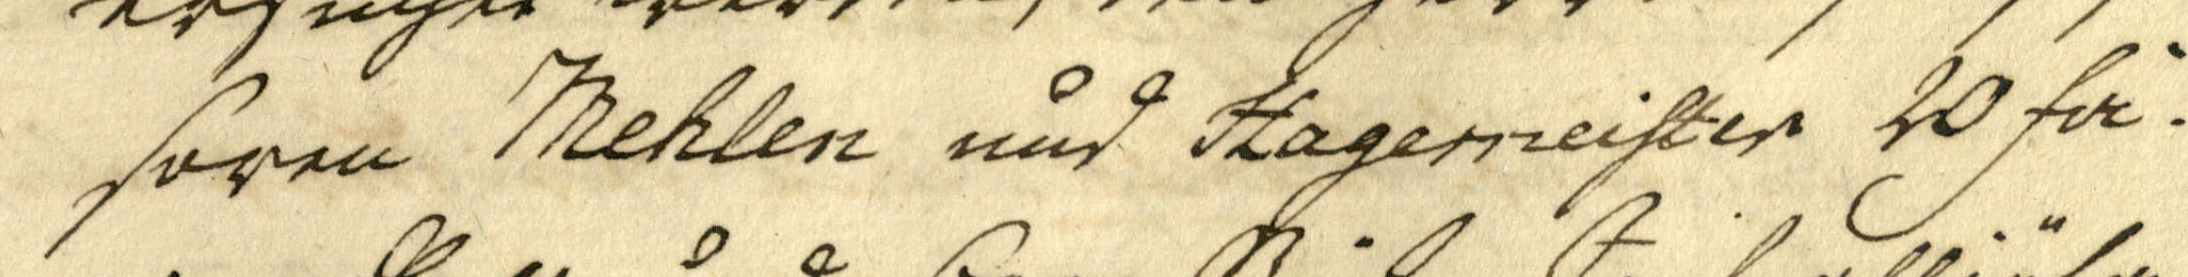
soren Mehlen und Hagemeister 20 Fa¬
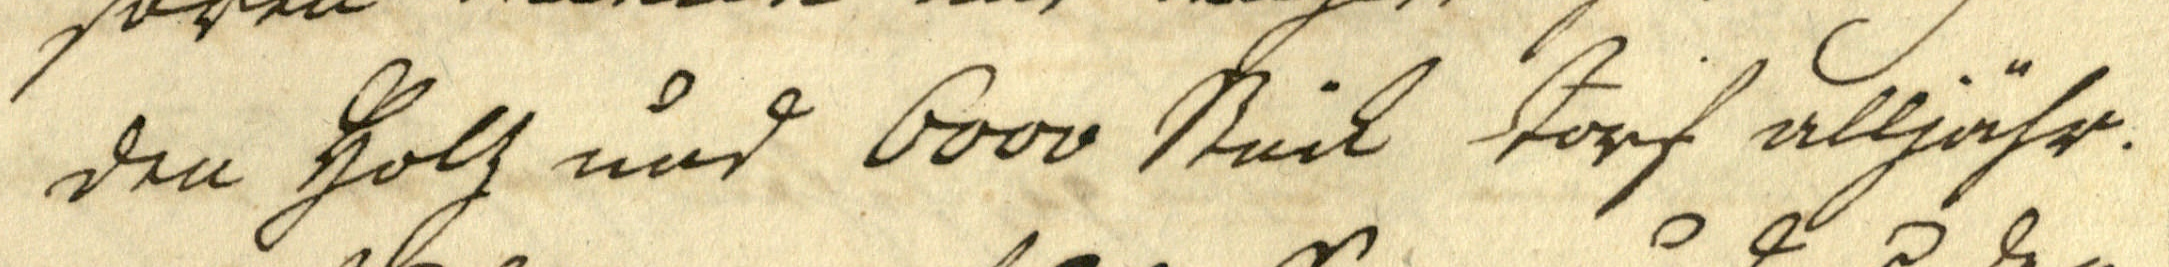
den Holz und 6000 Stück Torf alljähr¬
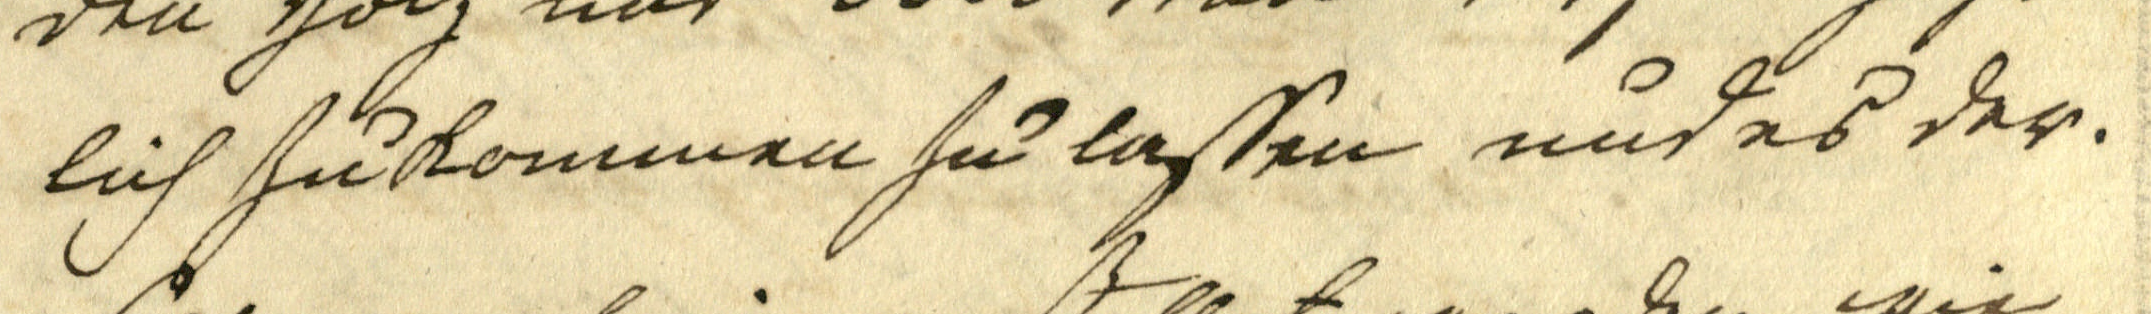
lich zukommen zu lassen und es der¬
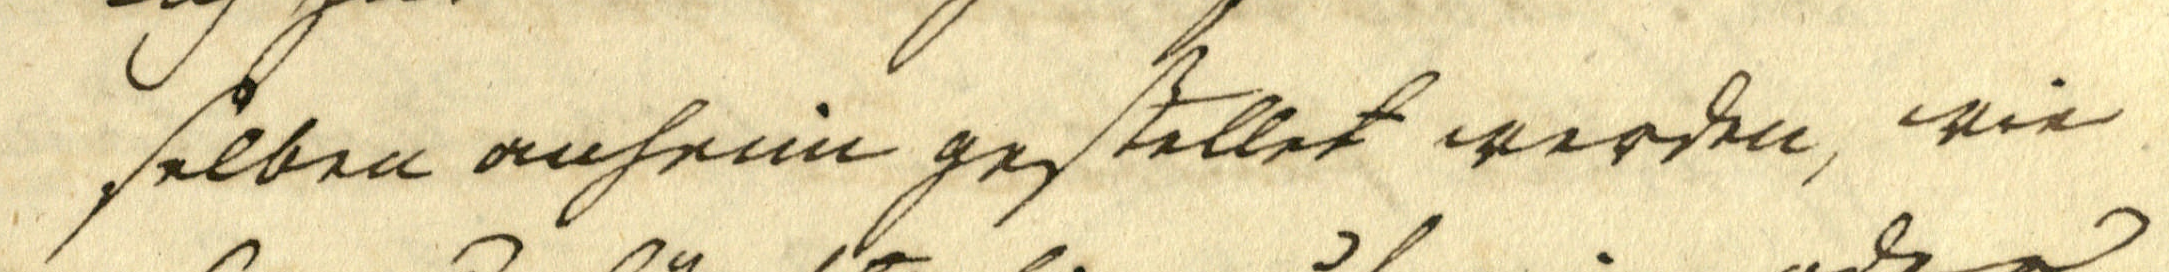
selben anheim gestellet werden, wie
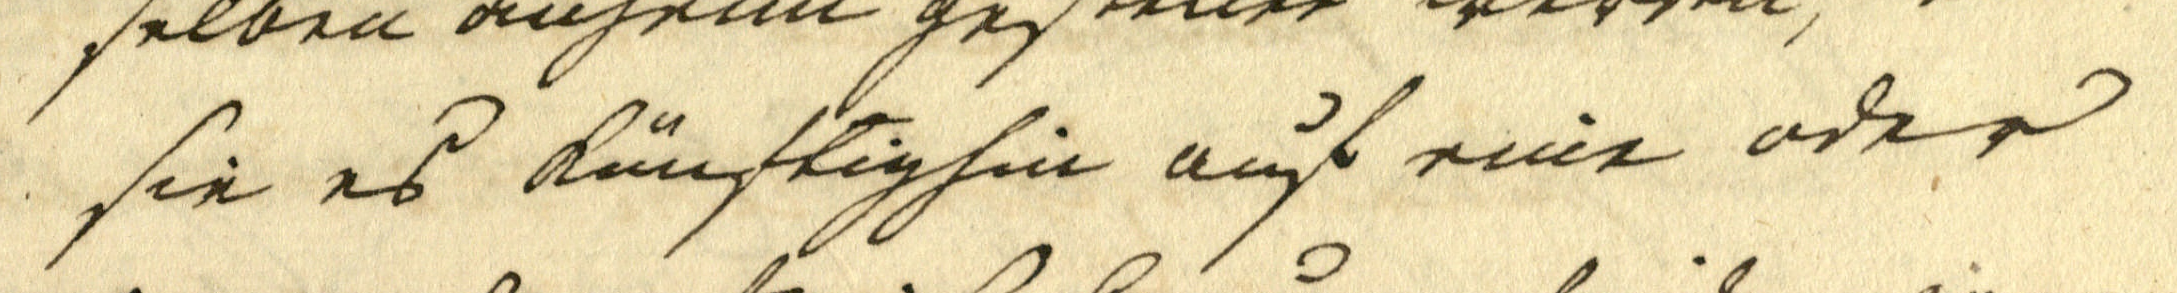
sie es künftighin auf eine oder
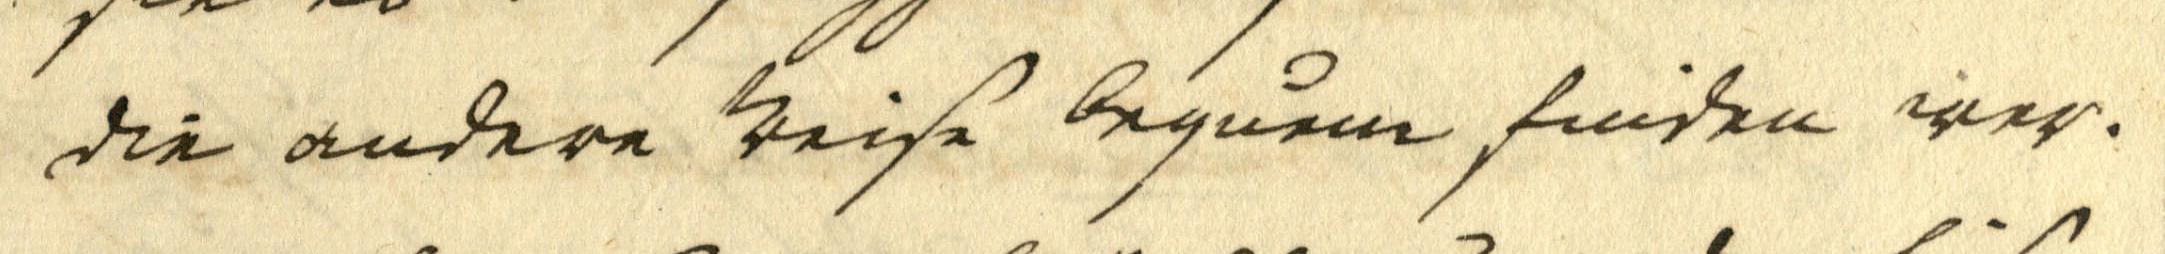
die andere Weise bequem finden wer¬
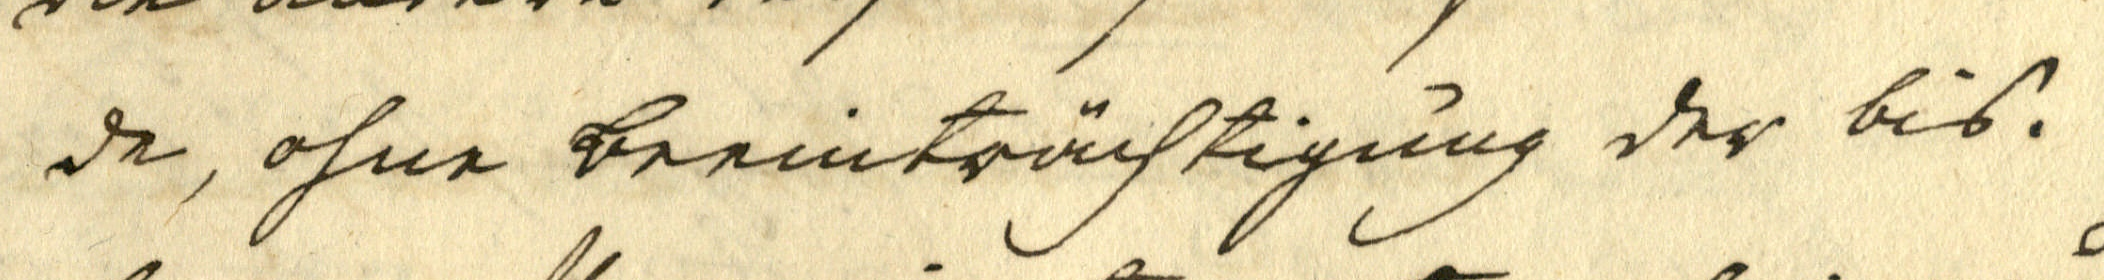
de, ohne Beeinträchtigung der bis¬
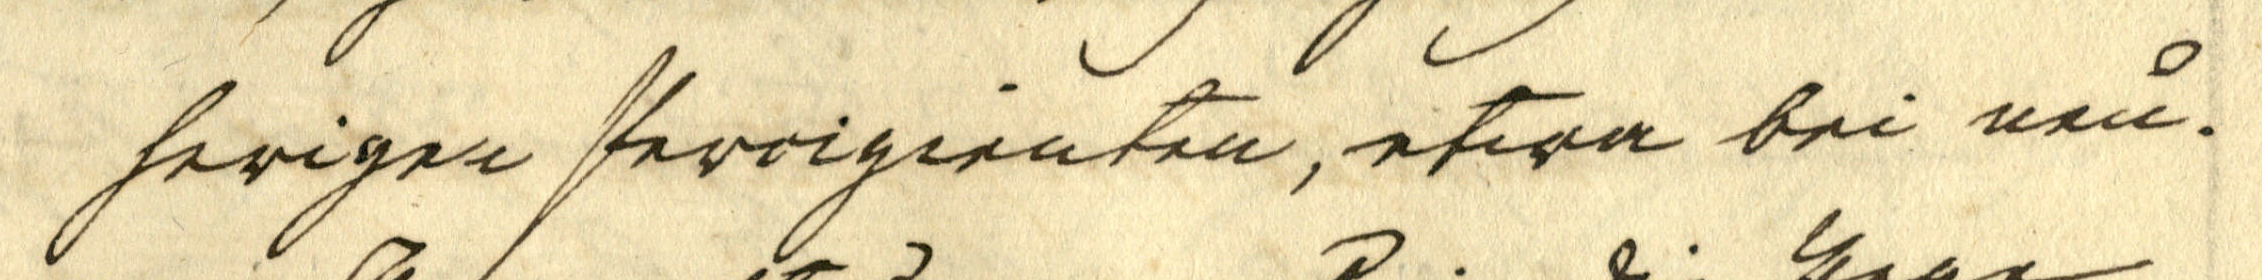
herigen Percipienten, etwa bei neu¬
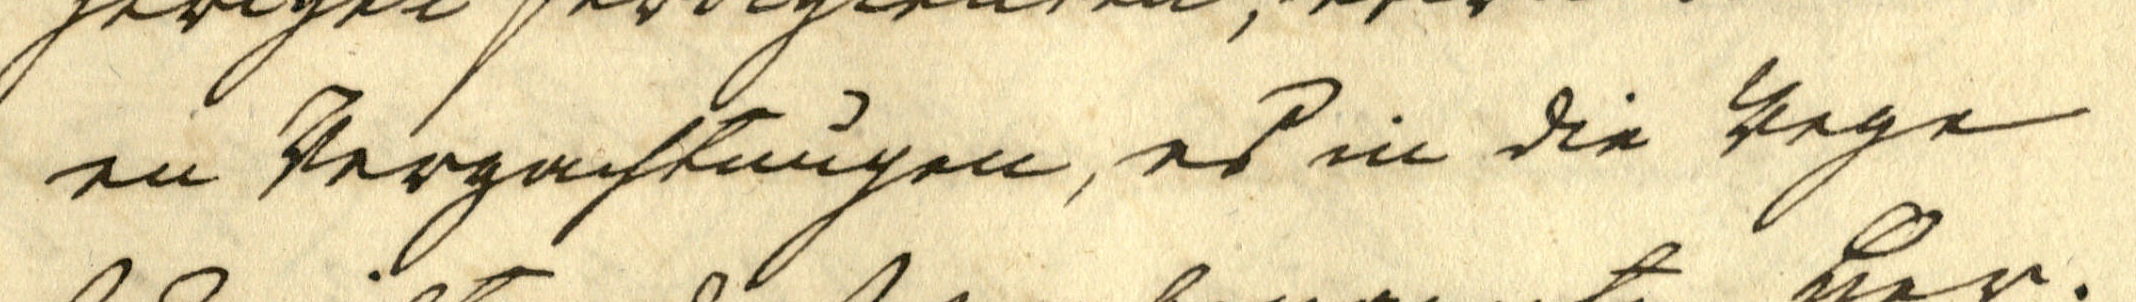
en Verpachtungen, es in die Wege
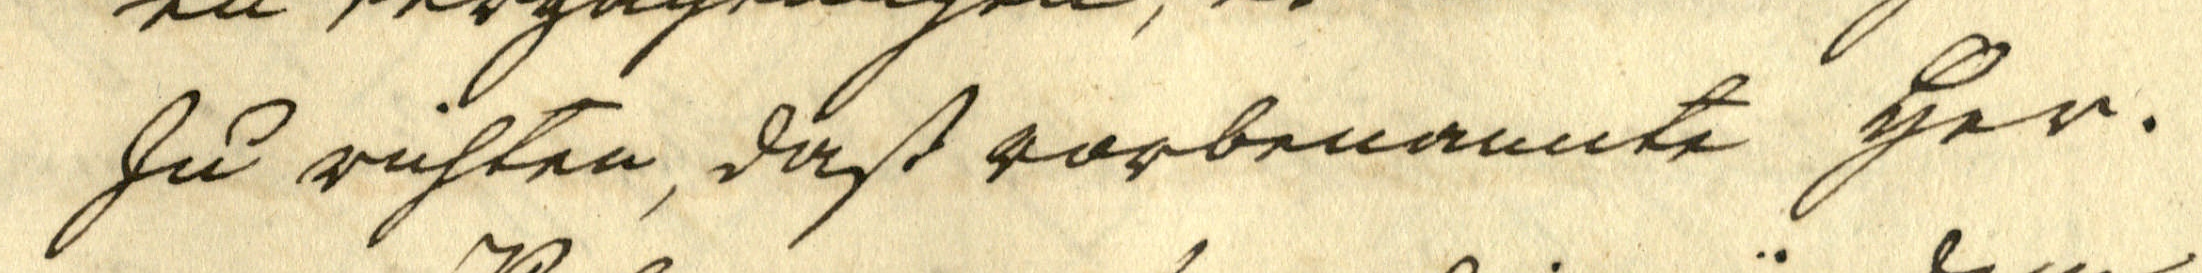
zu richten, daß vorbenannte Her¬
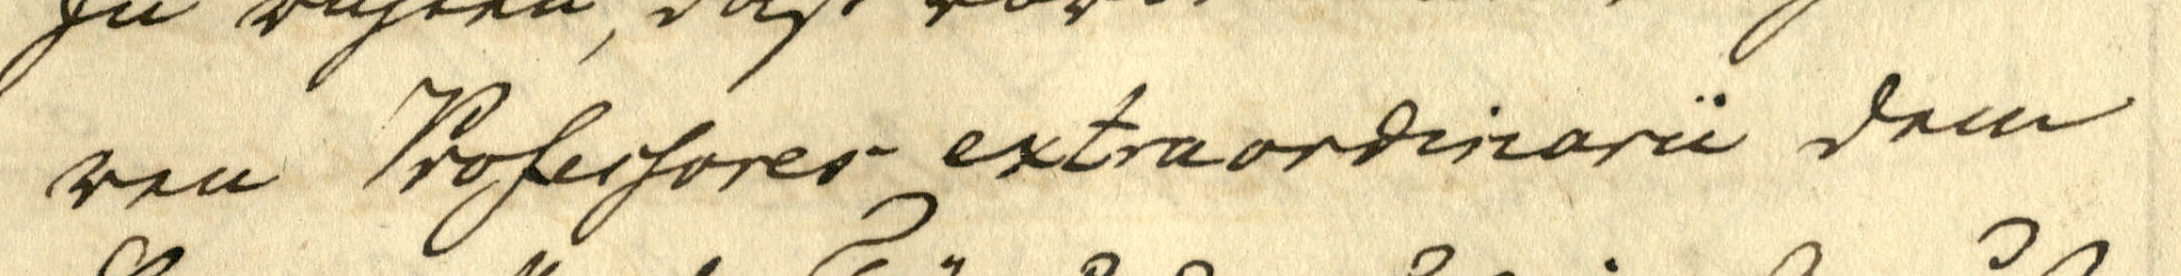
ren Professores extraordinarii dem
